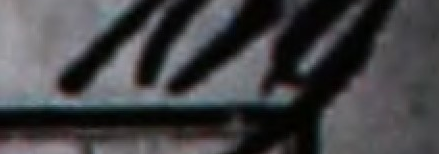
769
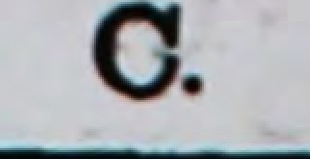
C.
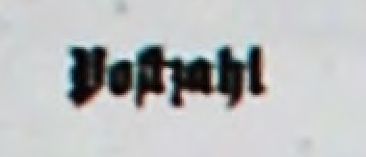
Postzahl
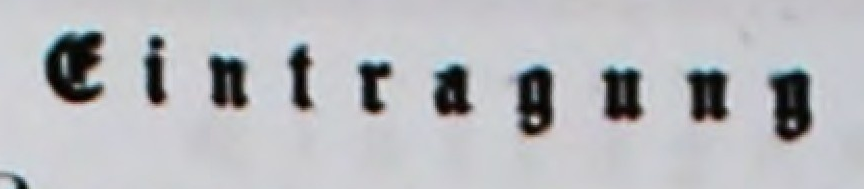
Eintragung
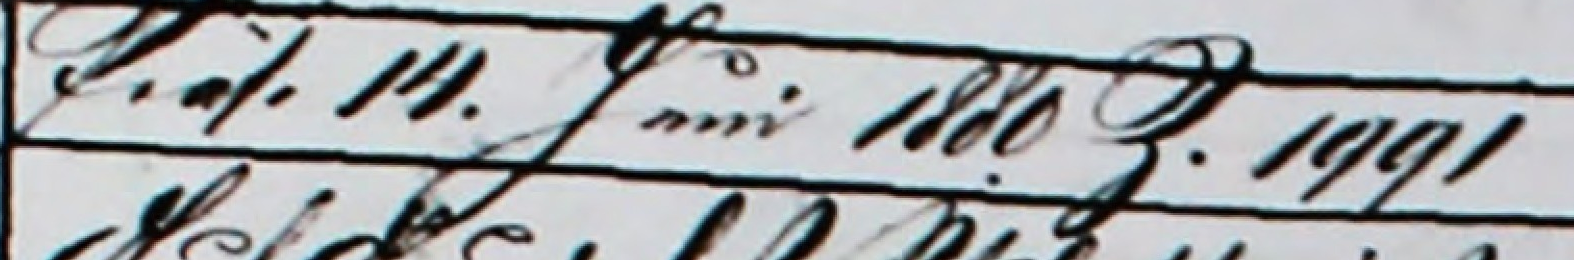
Präs: 14. Juni 1880 Z. 1991
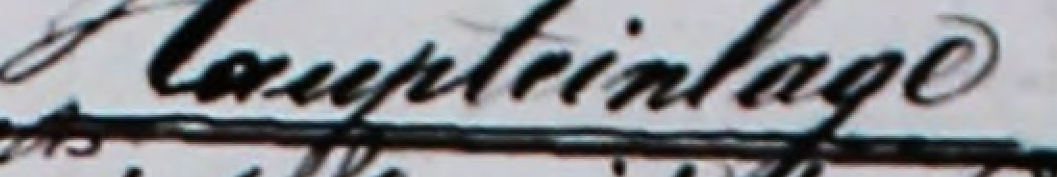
Haupteinlage
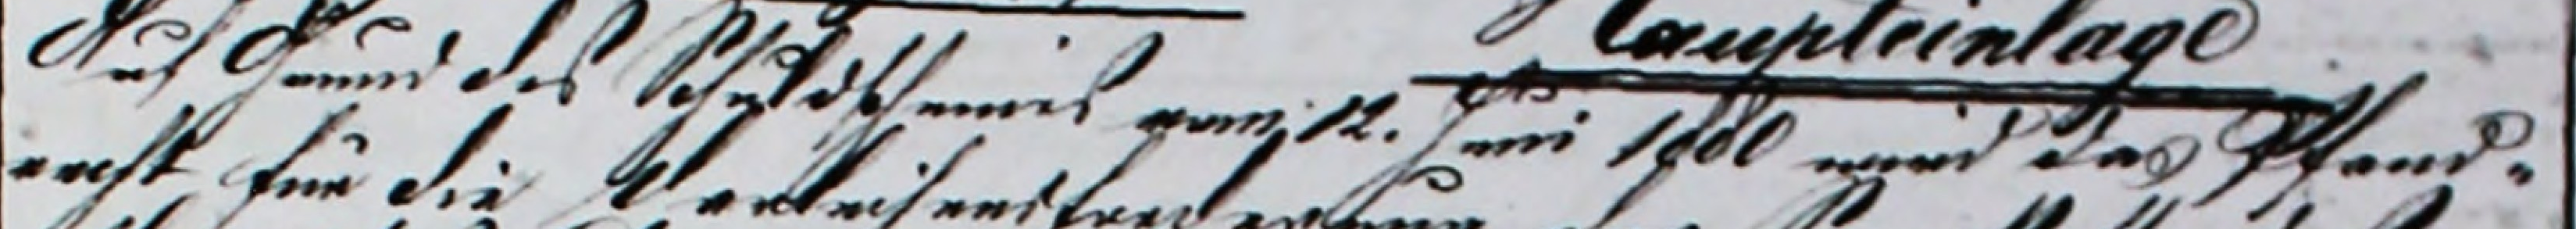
Auf Grund des Schuldscheines vom 12. Juni 1880 wird das Pfand„
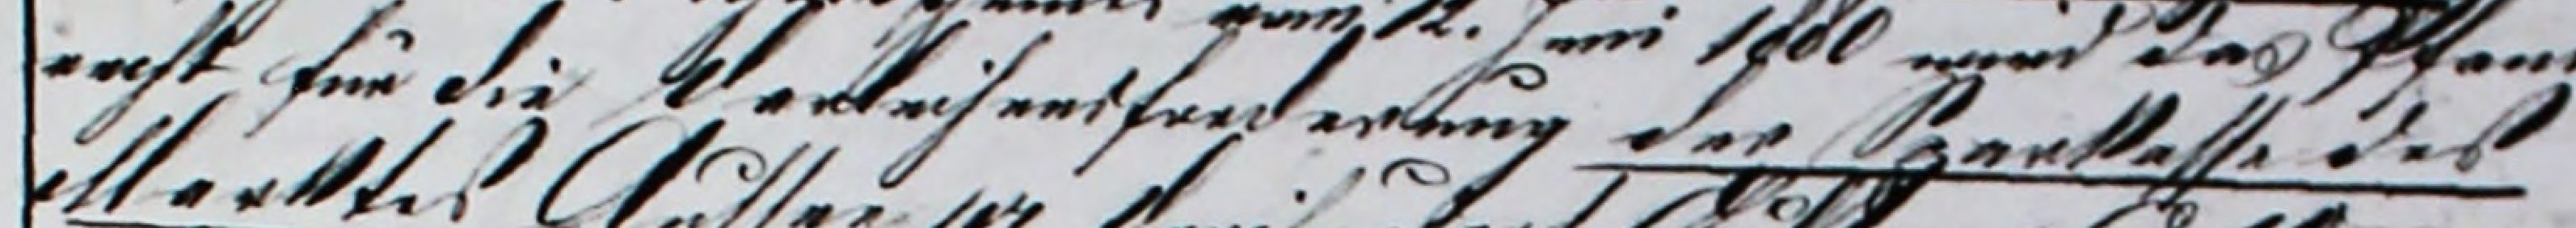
recht für die Darleihensforderung der Sparkasse des
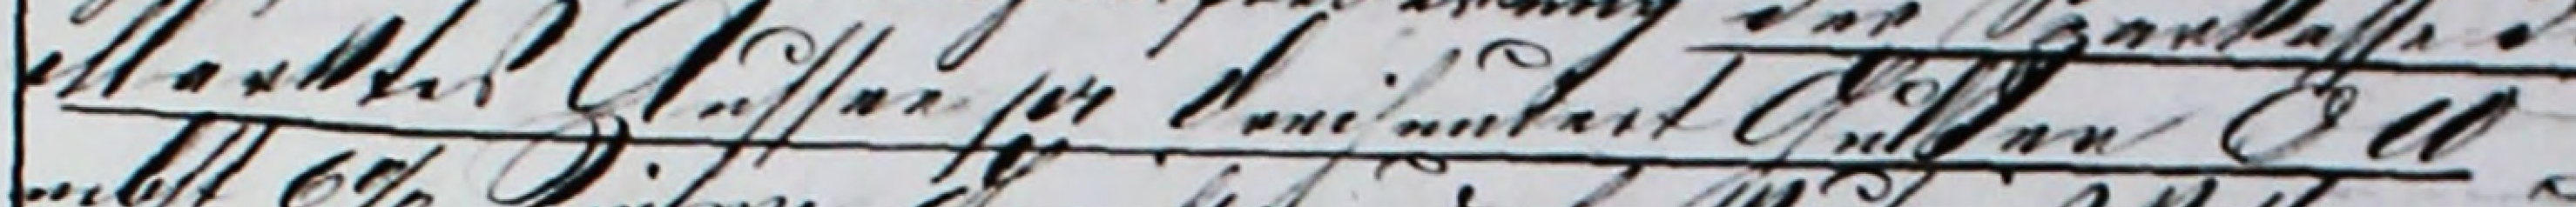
Marktes Aussee pr Dreihundert Gulden OW
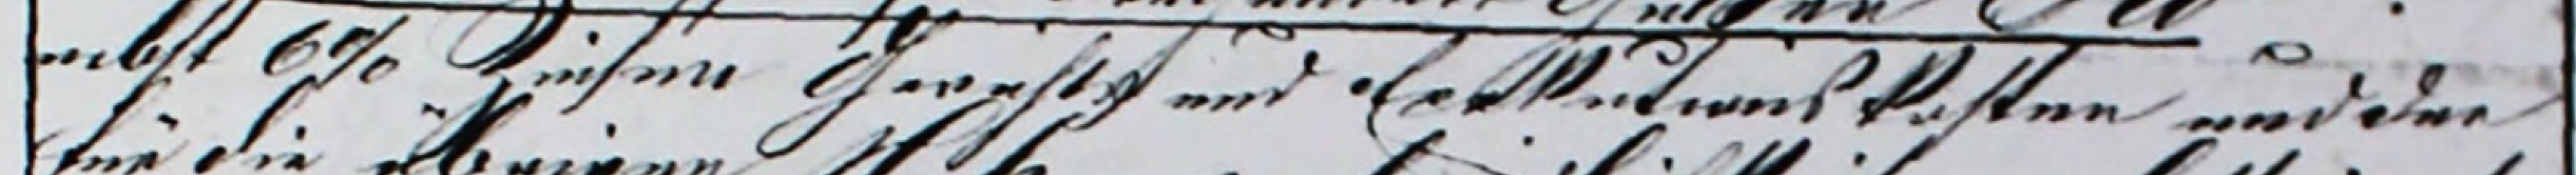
nebst 6% Zinsen Gerichts und Exekutions Kasten und der
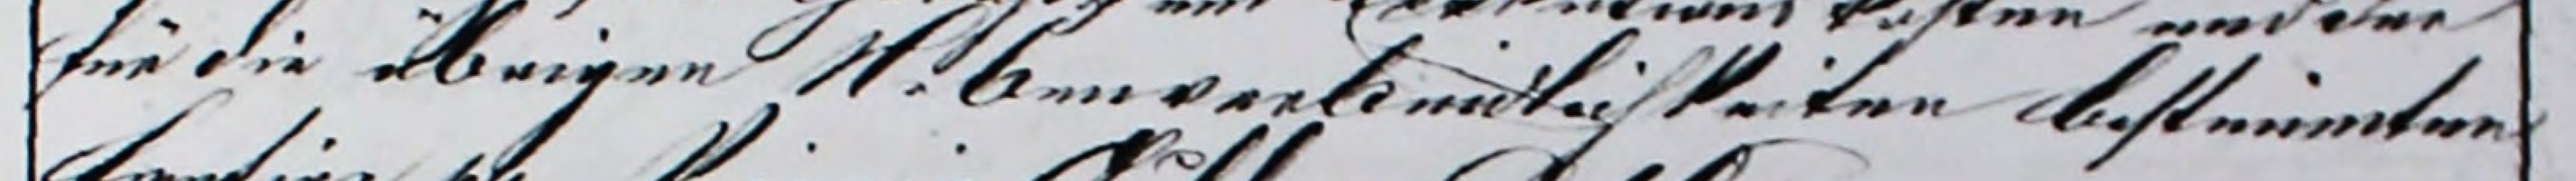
für die übrigen Nebenverbindlichkeiten bestimmten
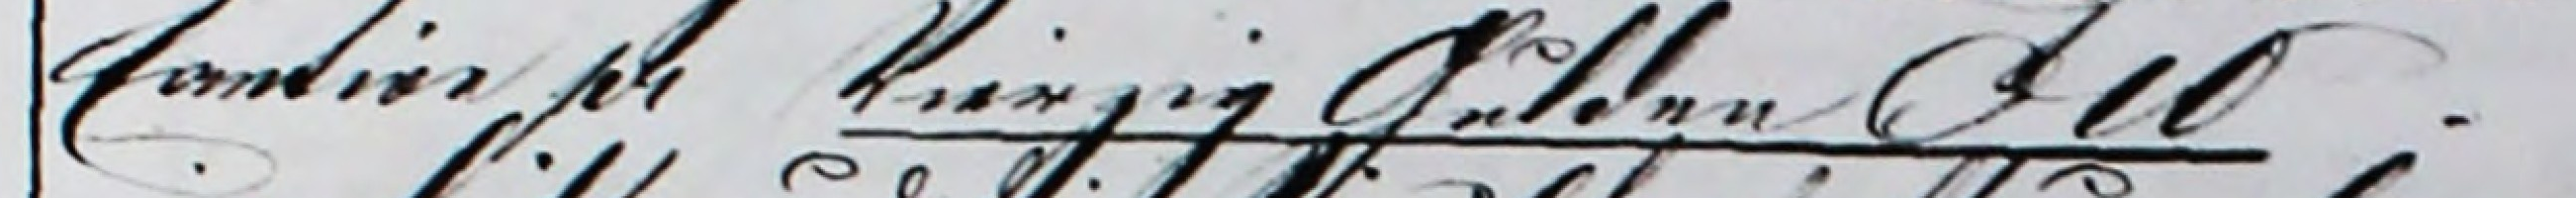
Cantion pr Vierzig Gulden OW
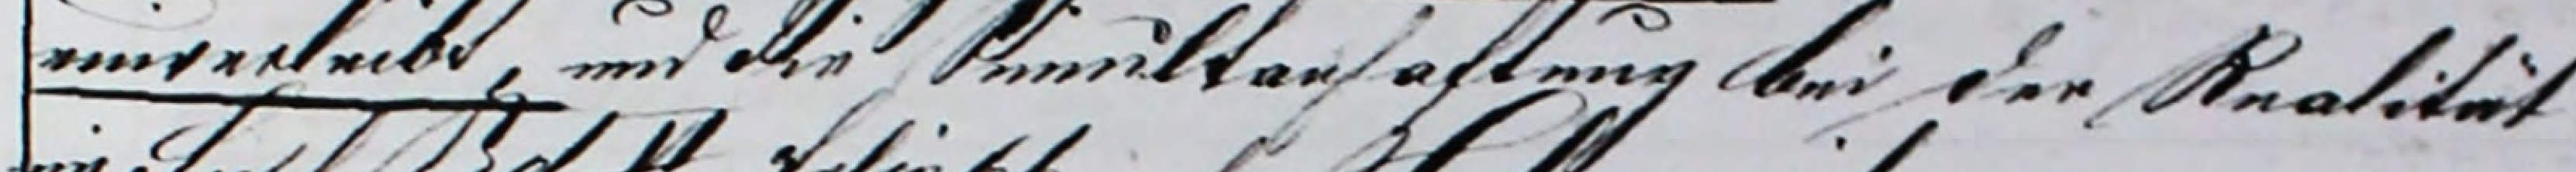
einverleibt und die Simultanhaftung bei der Realität
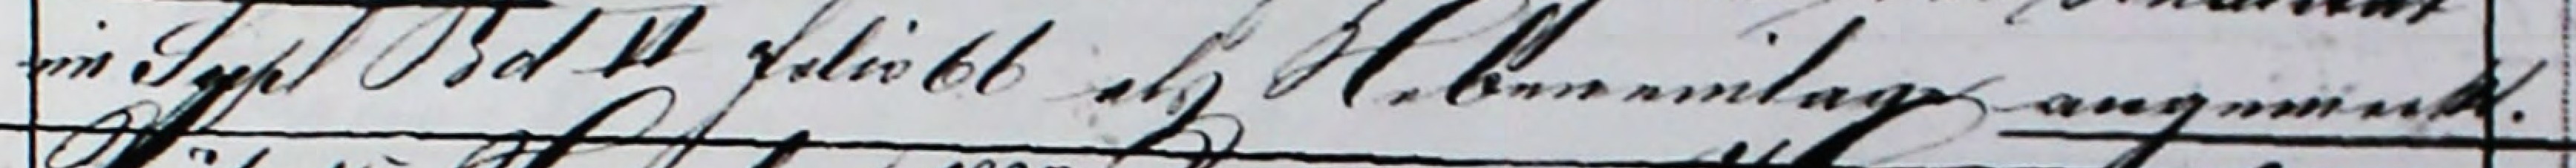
im Sech Bd VI falio 66 als Nebeneinlage angemerkt.
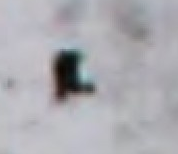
fl.
